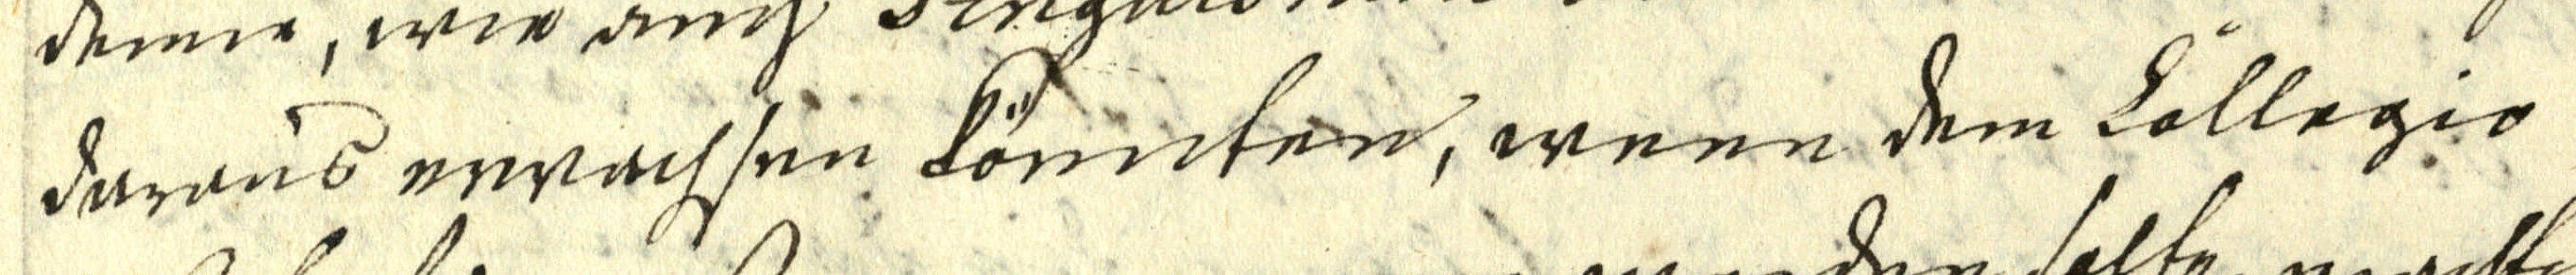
daraus erwachsen könnten, wenn dem Collegio
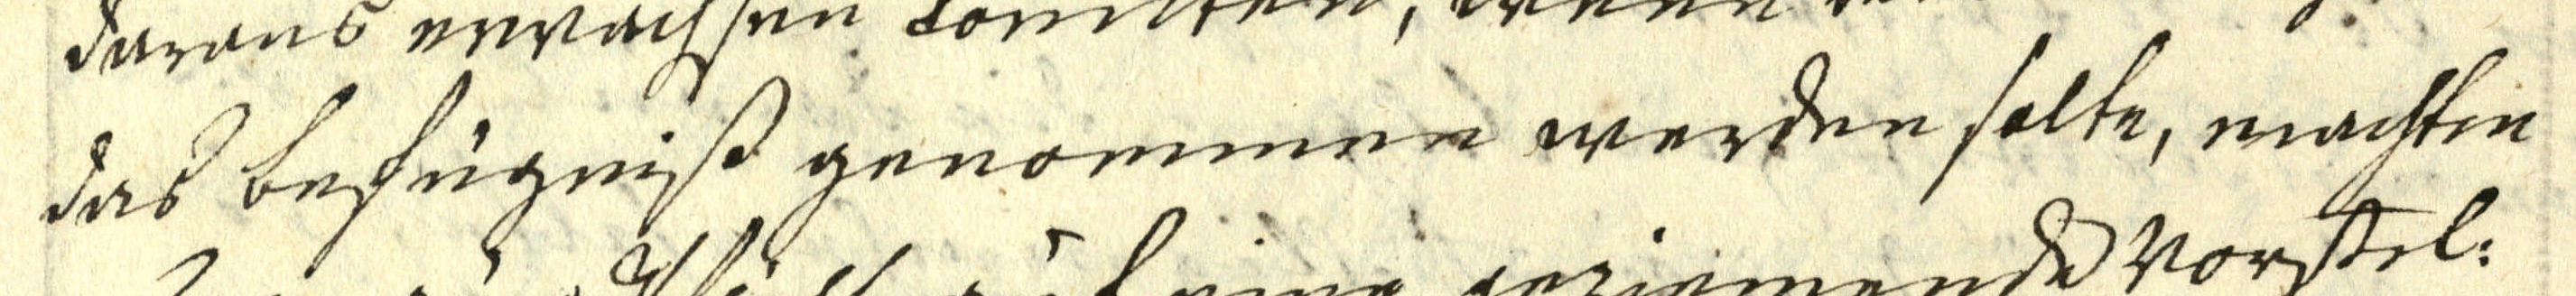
das Befugniß genommen werden solte, machten
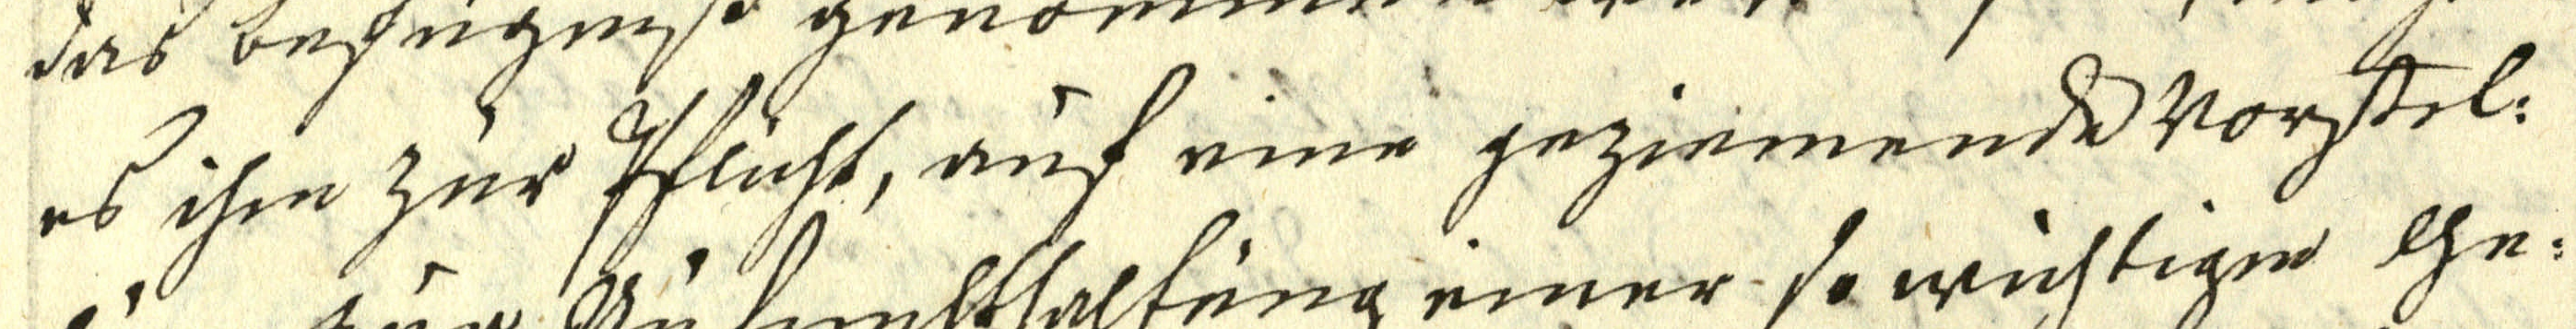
es ihm zur Pflicht, auf eine geziemende Vorstel¬
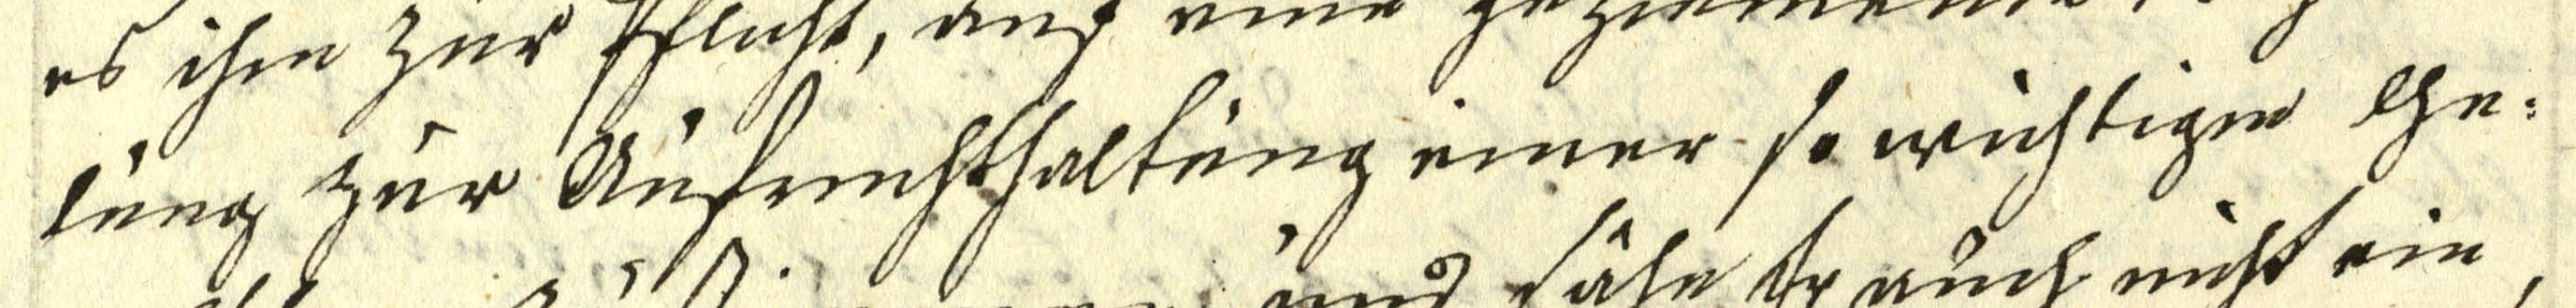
lung zur Aufrechthaltung einer so wichtigen Ge¬
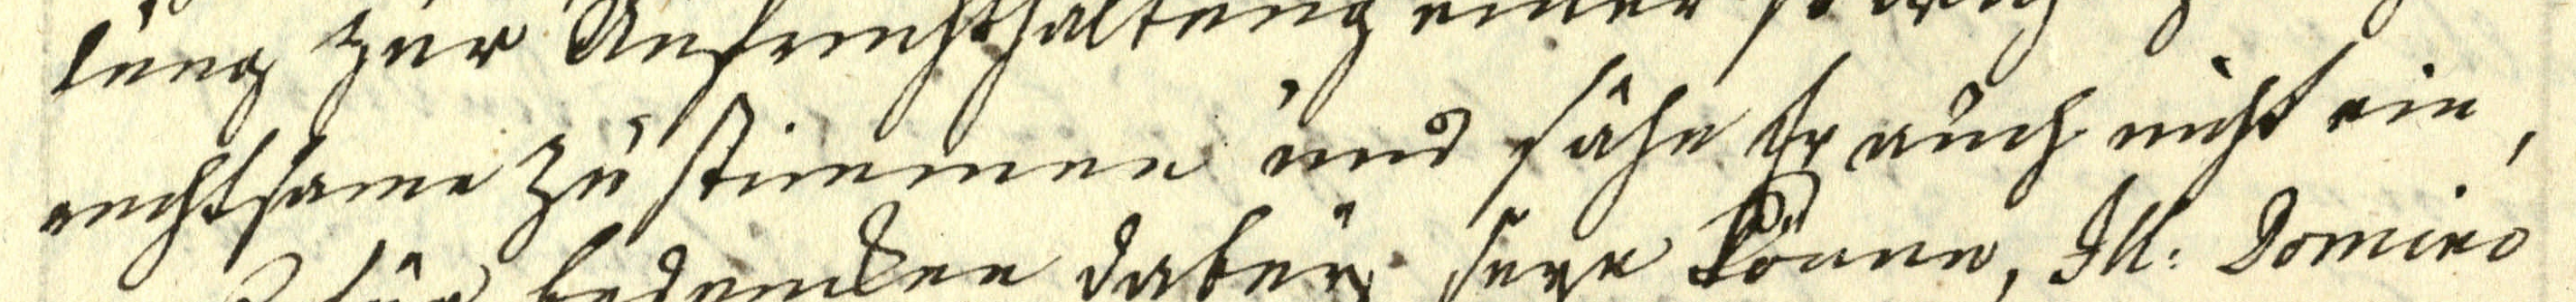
rechtsame zu stimmen und sähe Er auch nicht ein,
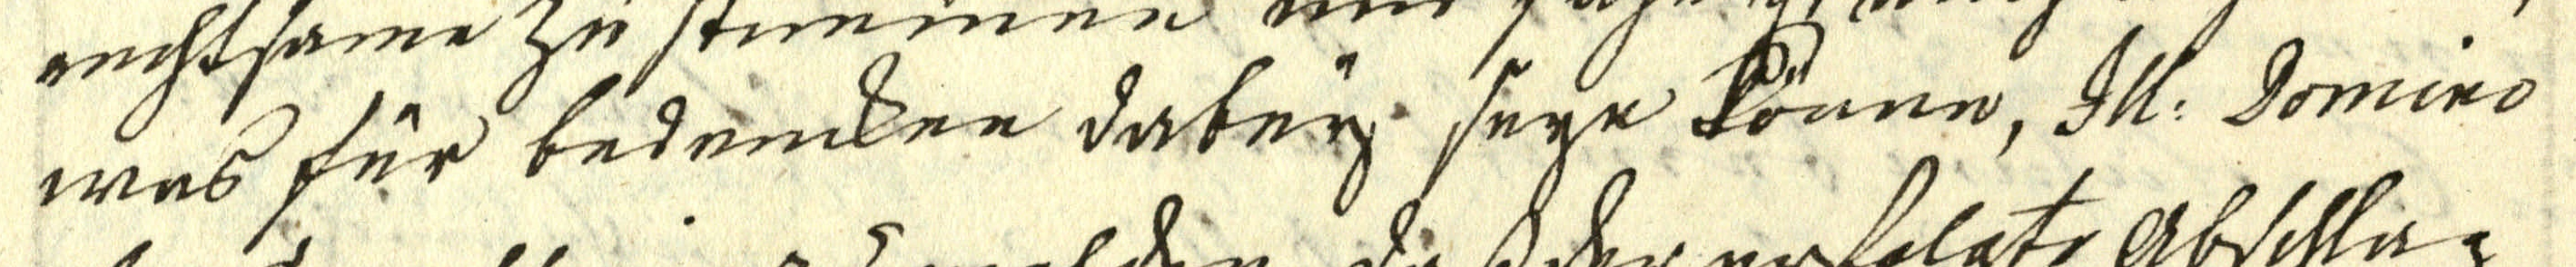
was für Bedencken dabei seÿn könne, Ill. Domino
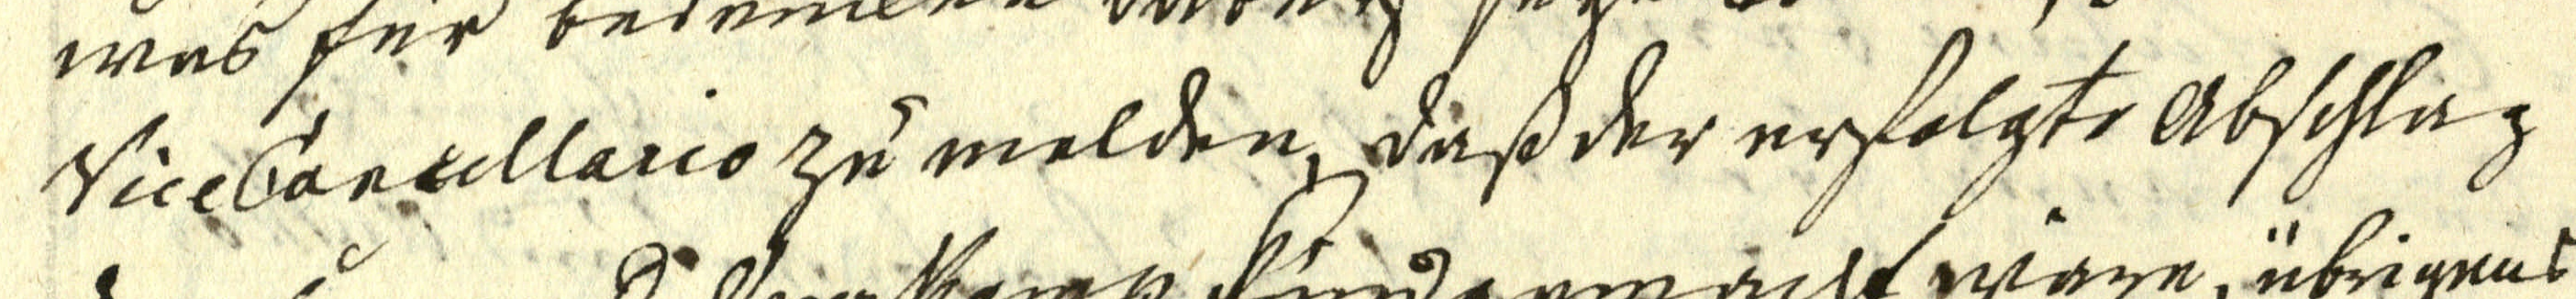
Vice Cancellario zu melden daß der erfolgte Abschlag
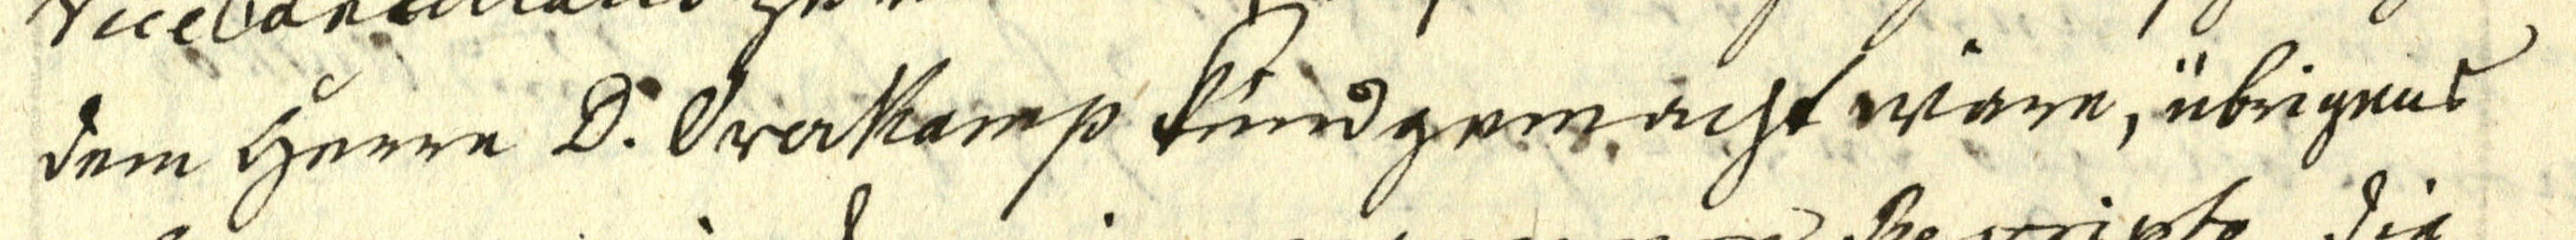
dem Herrn D. Overkamp kundgemacht wäre, übrigens
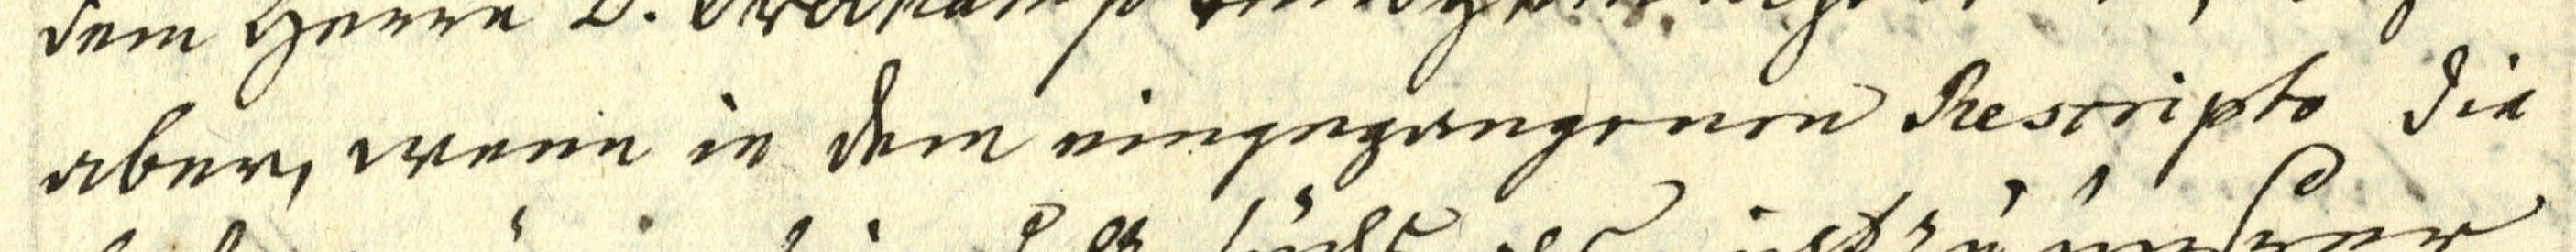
aber, wenn in dem eingegangenen Rescripto die
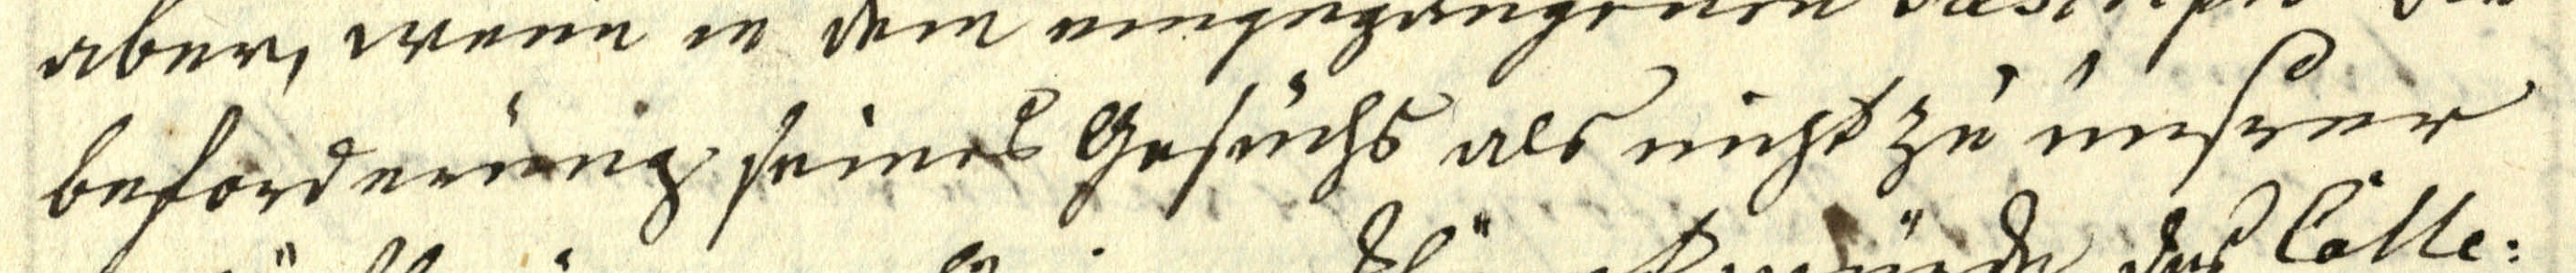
Beforderung seines Gesuchs als nicht zu unsrer
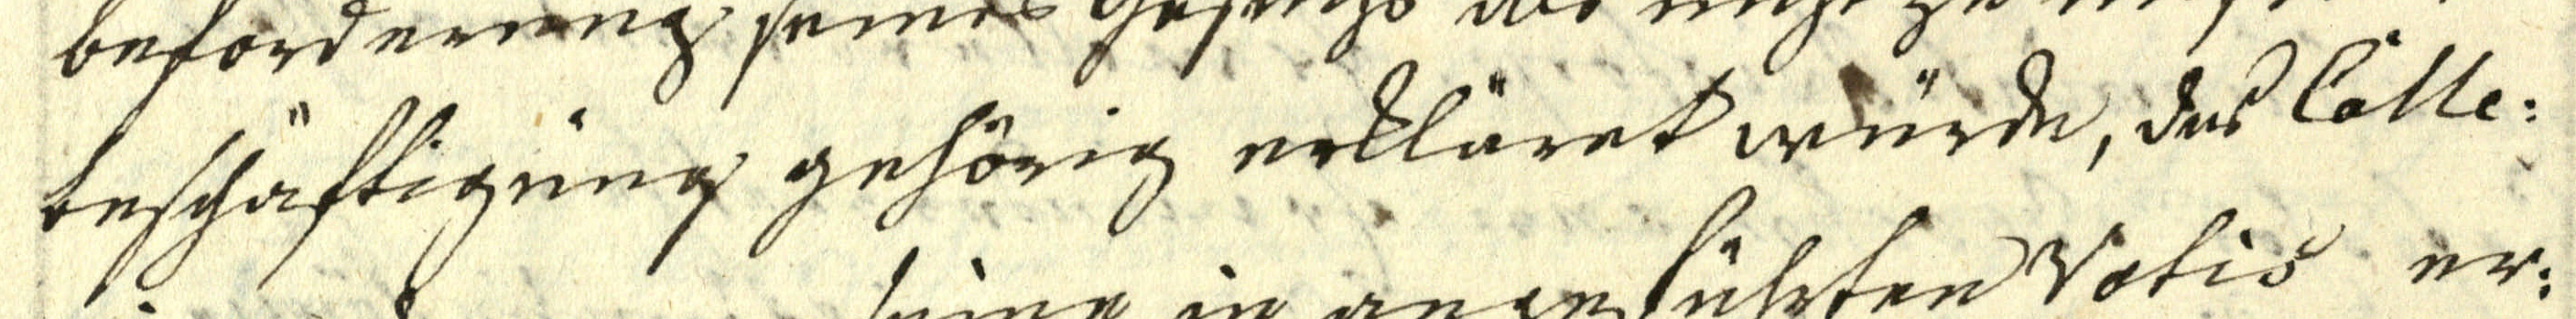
Beschäftigung gehörig erkläret würde, das Colle¬
